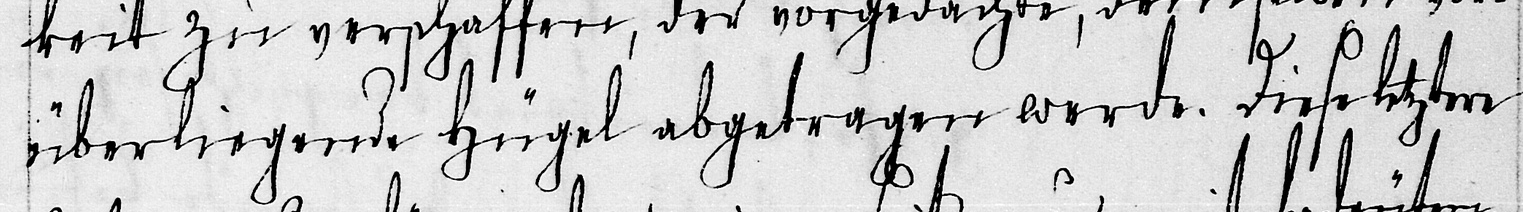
überliegende Hügel abgetragen werde. Diese letztere
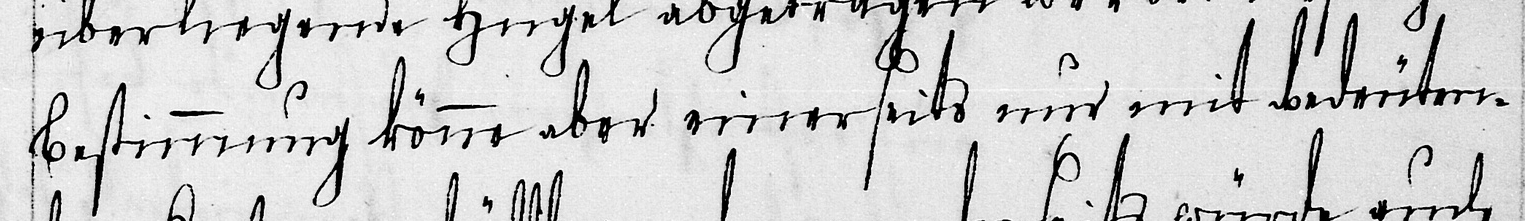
Bestimmung könne aber einerseits nur mit bedeuten¬
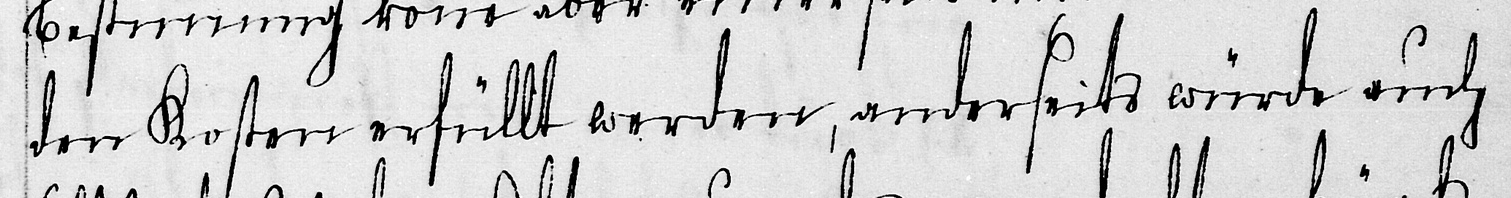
den Kosten erfüllt werden, anderseits würde auch
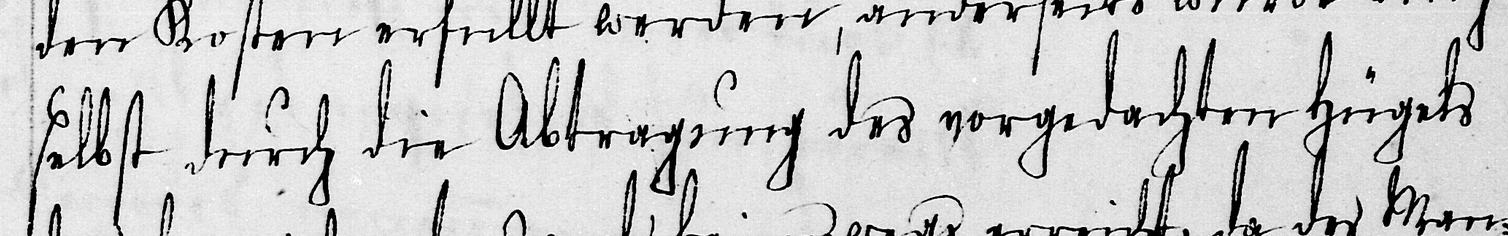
selbst durch die Abtragung des vorgedachten Hügels
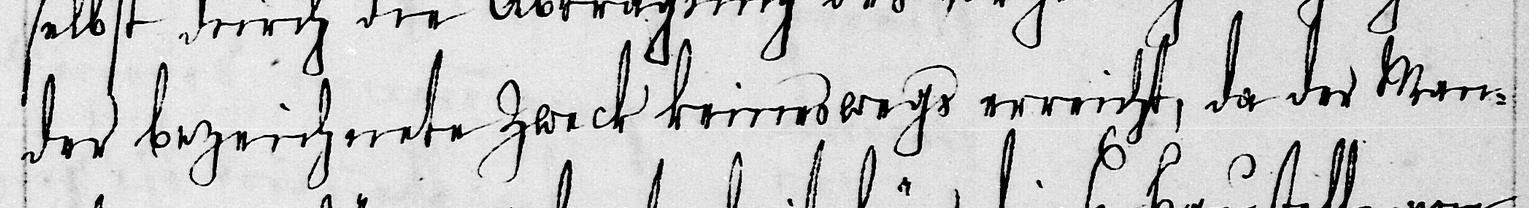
der bezeichnete Zweck keineswegs erreicht, da der Man¬
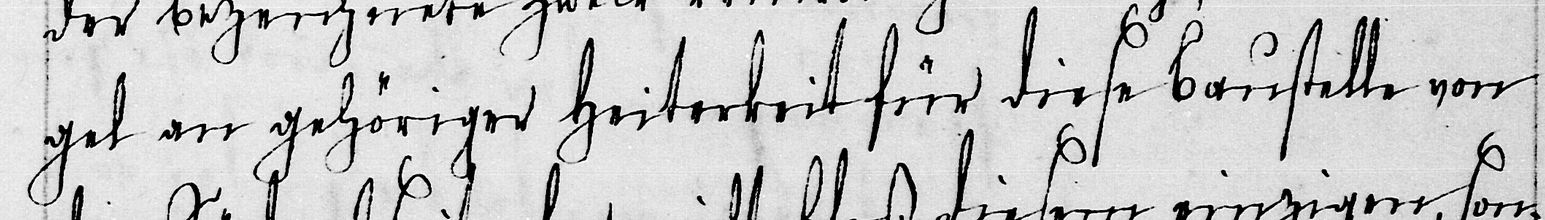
gel an gehöriger Heiterkeit für diese Baustelle von
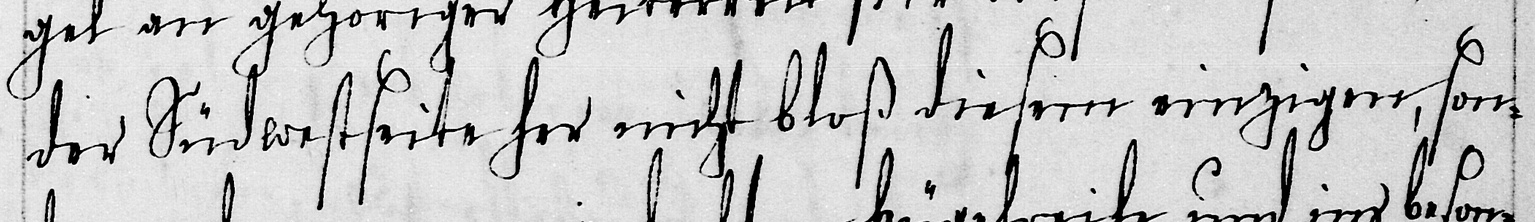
der Südwestseite her nicht bloß diesem einzigen, son¬
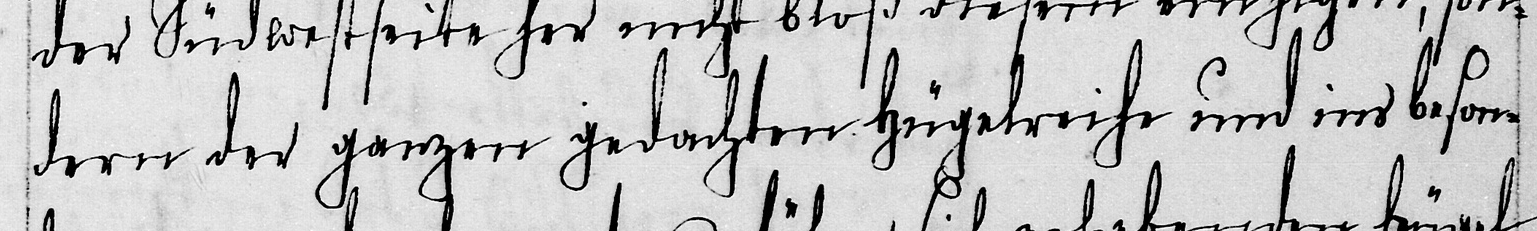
dern der ganzen gedachten Hügelreihe und ins beson¬
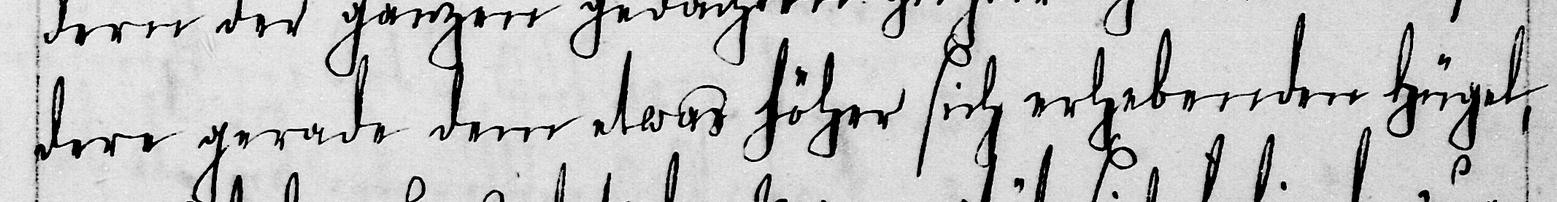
dere gerade dem etwas höher sich erhebenden Hügel,
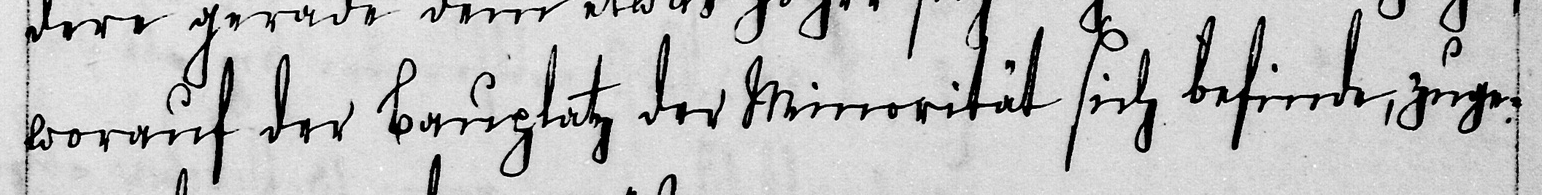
worauf der Bauplatz der Minorität sich befinde, zuge¬
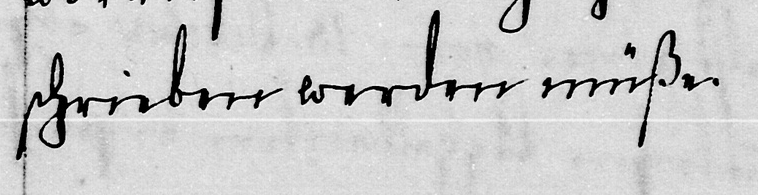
schrieben werden müße.
